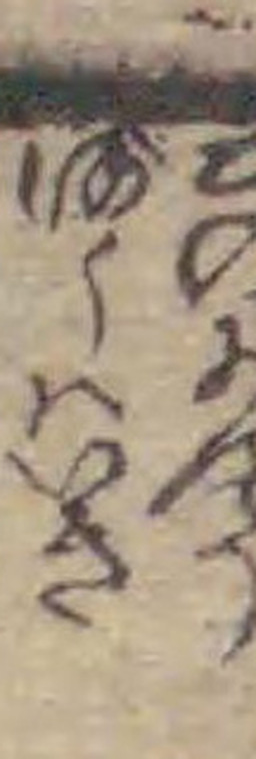ぼうはいき
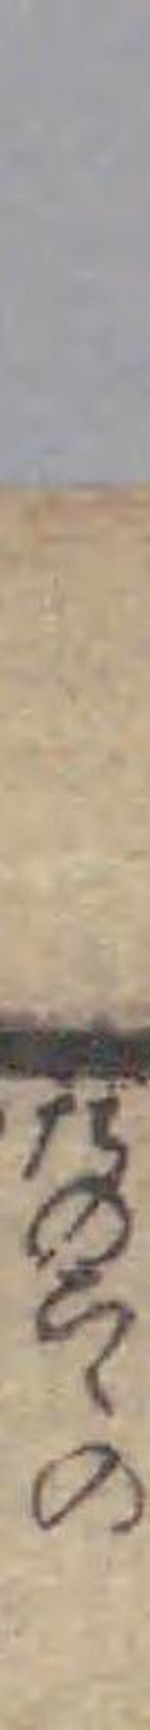たのこゝの
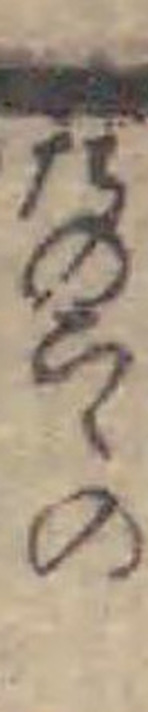たのこゝの
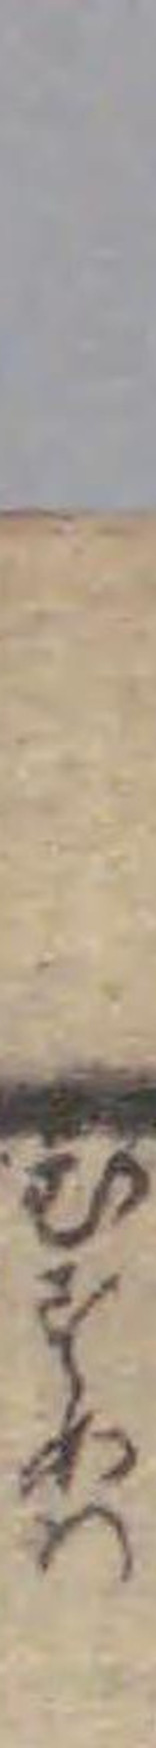むすめは
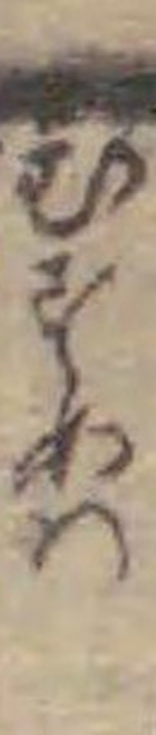むすめは
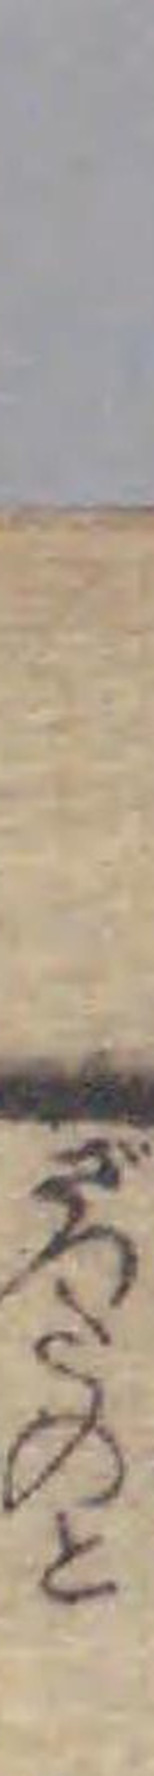ざつたのと
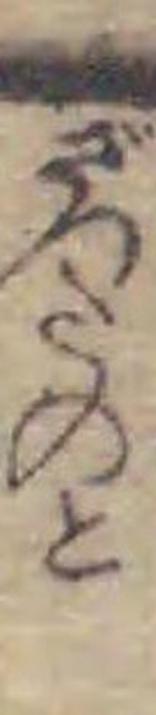ざつたのと
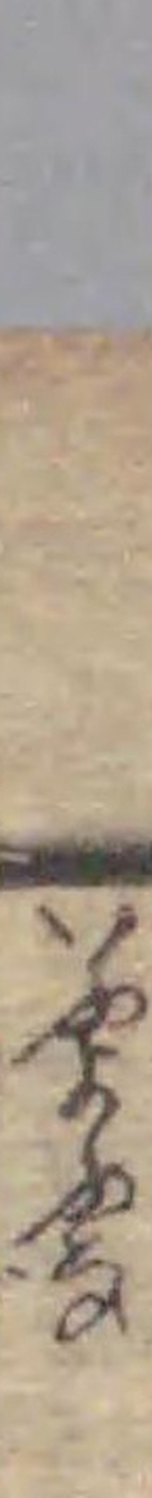いふよふな
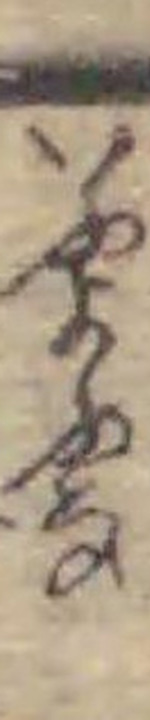いふよふな
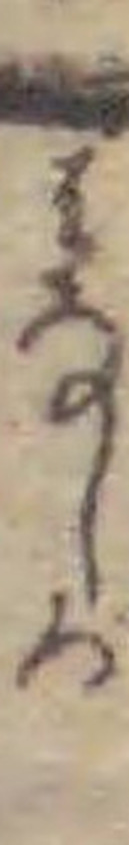はなしが
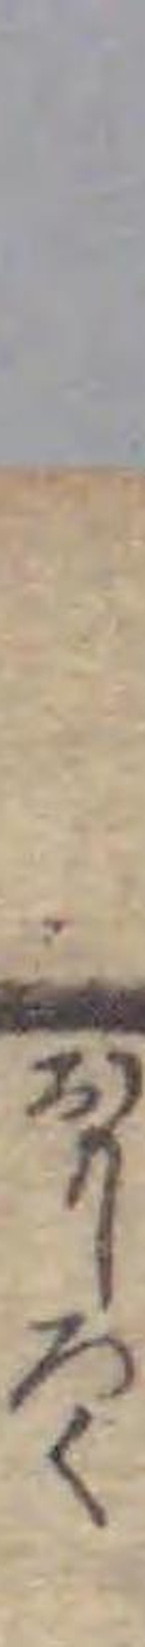おもしろく
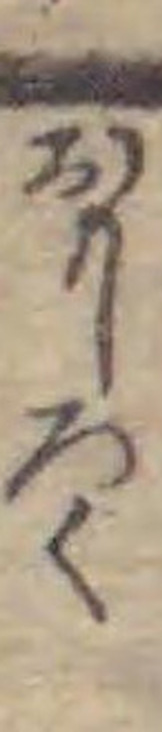おもしろく
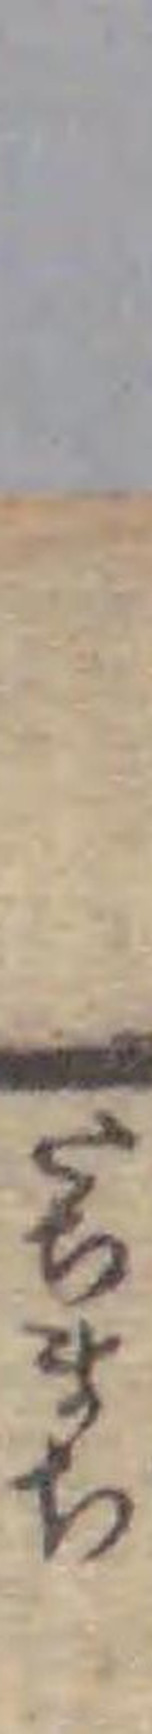たちまち
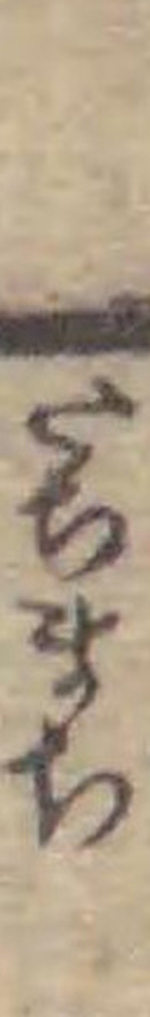たちまち
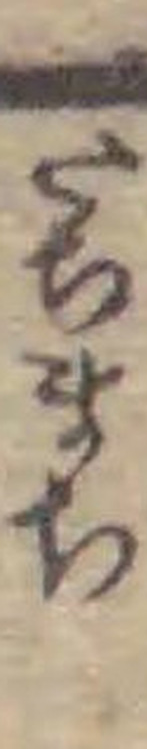たちまち
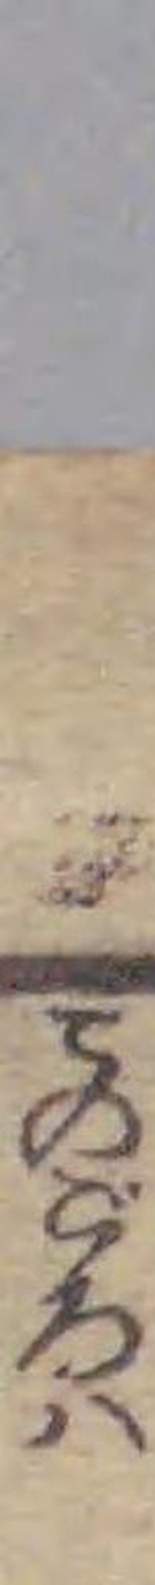このごろは
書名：通風伊勢物語 : 3巻
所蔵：国立国会図書館 National Diet Library, JAPAN
